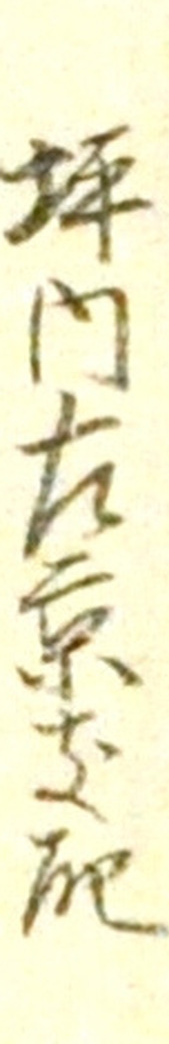坪内左京支配
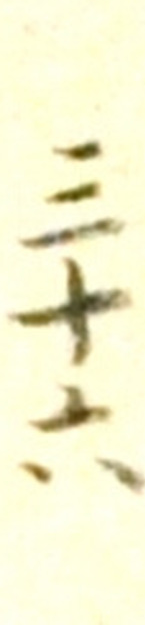三十六
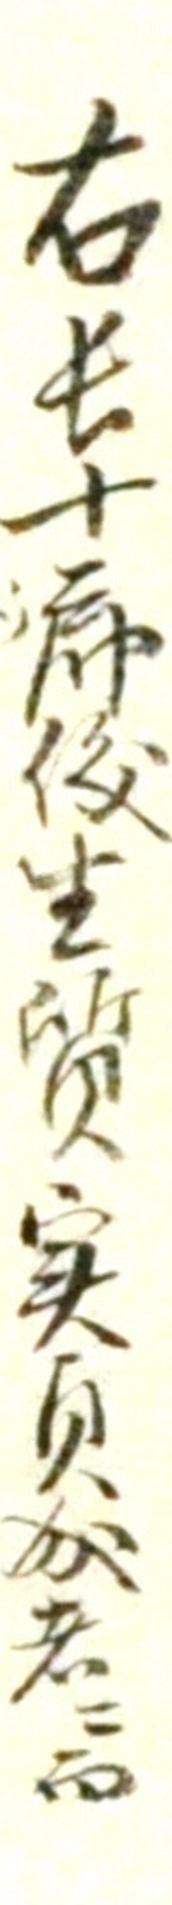右長十郎儀生質実貞成者にて
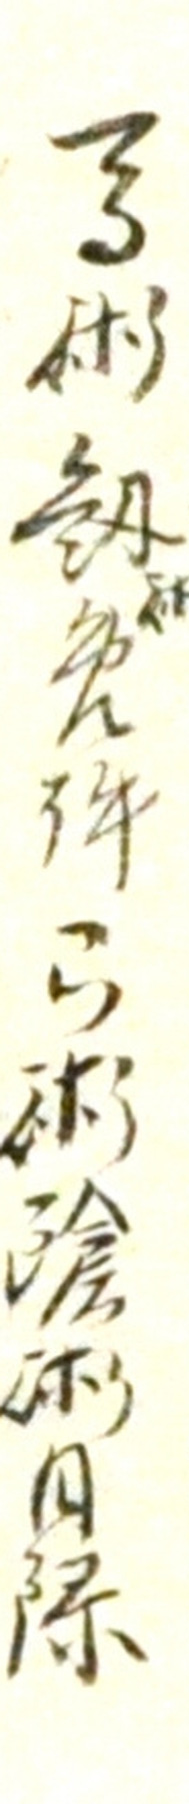馬術剣術免許弓術槍術目録
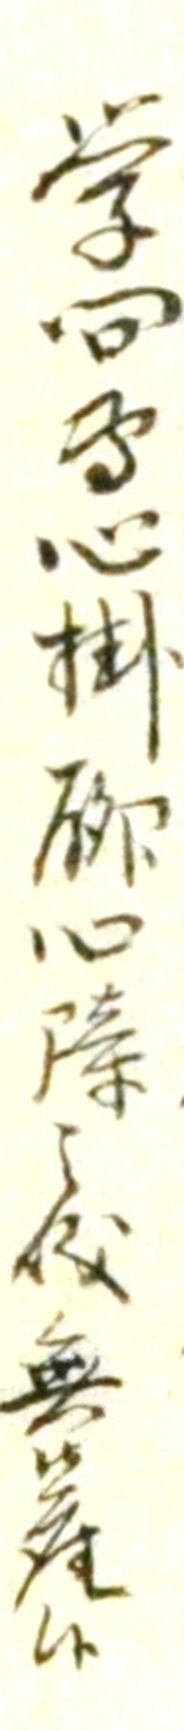学問専心掛心障之儀無御座候
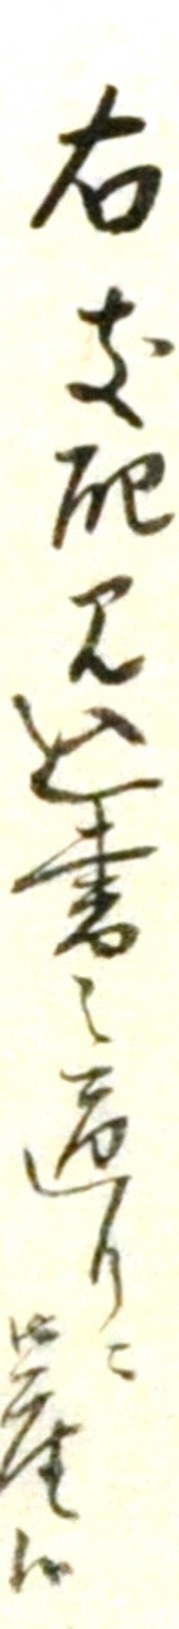右支配見込書通りに御座候
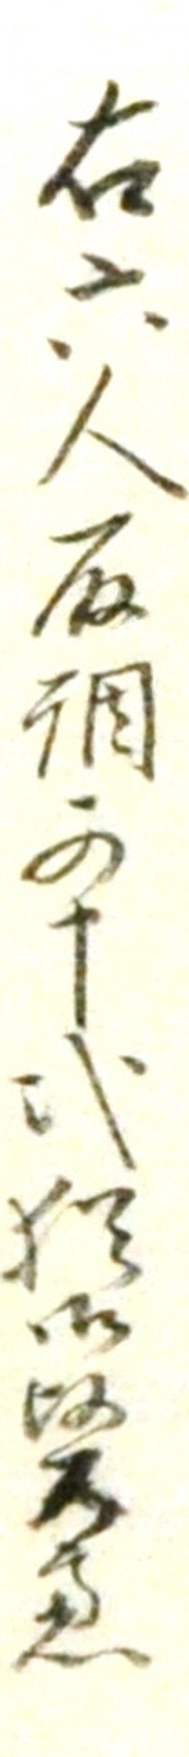右六人取調可申哉猶御賢慮
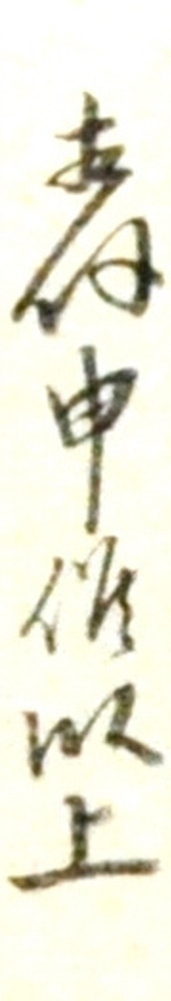相伺申候以上
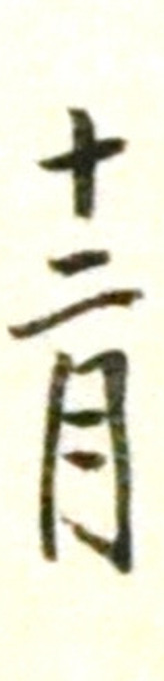十二月
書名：下調
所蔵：伊那市立高遠町図書館・合同会社AMANE
